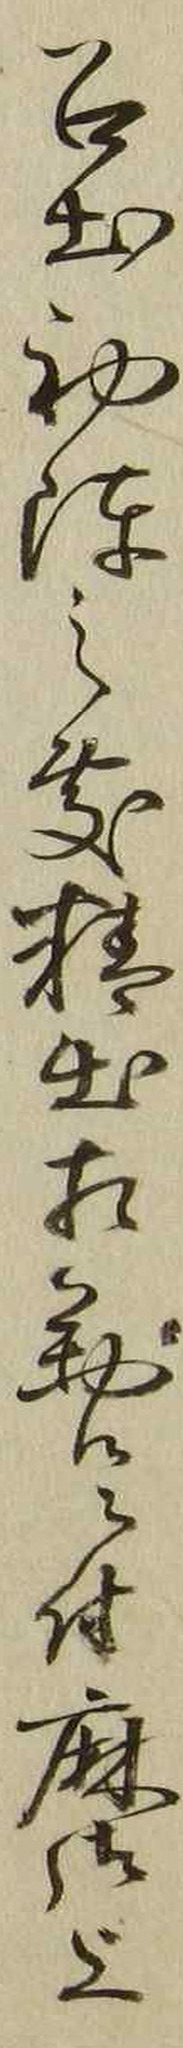召出初陣之処精出相勤候ニ付麻御上
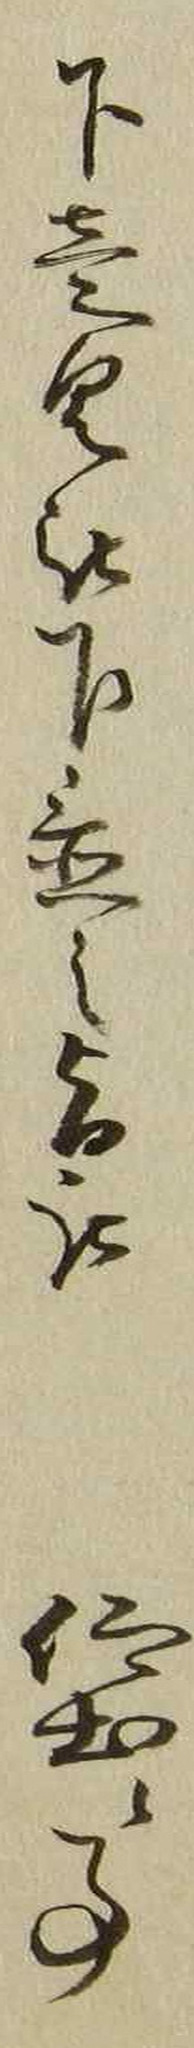下壱具被下置之旨被仰出候事
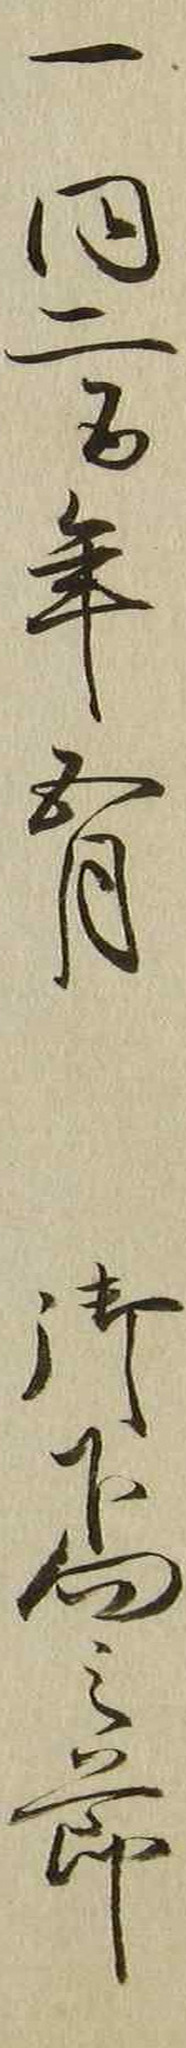一同二酉年五月御下向之節
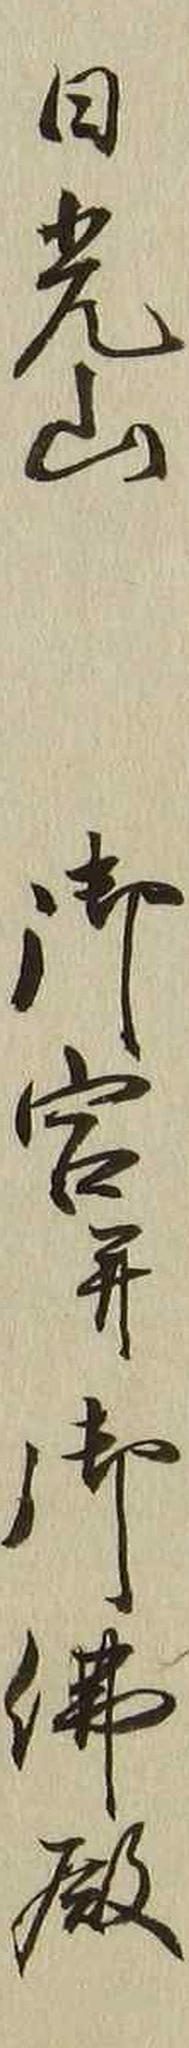日光山御宮幷御仏殿
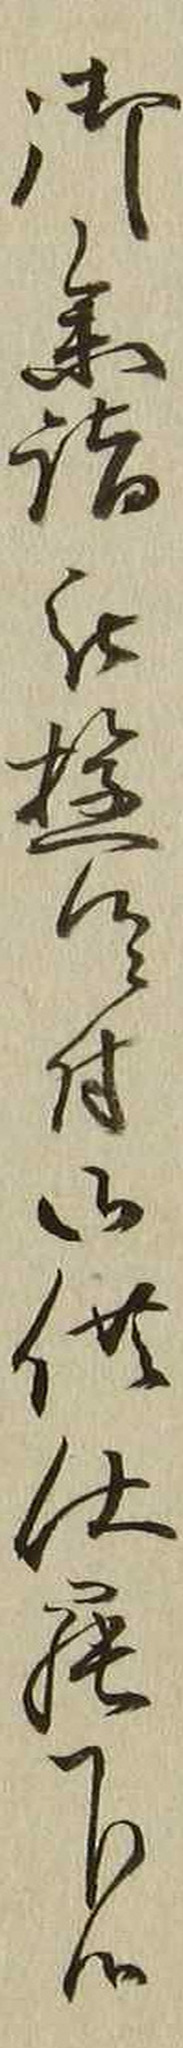御参詣被遊候ニ付御供仕罷下候
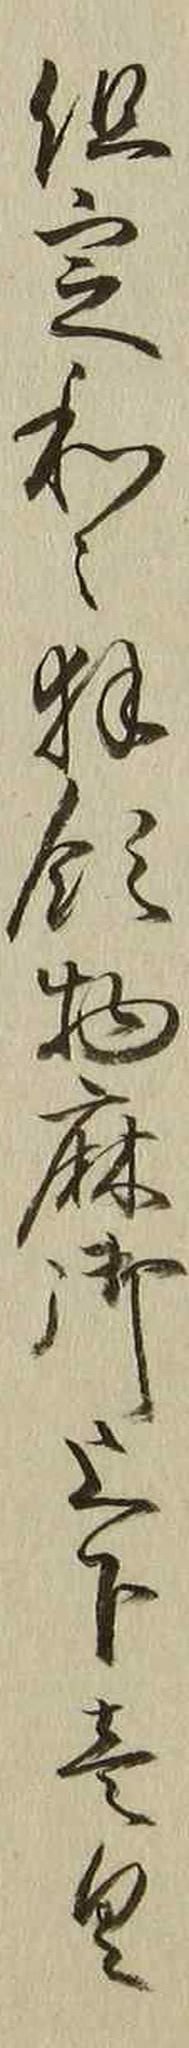但定和拝領物麻御上下壱具
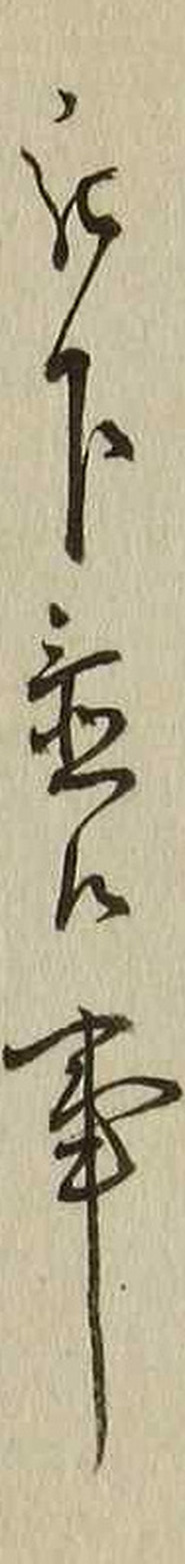被下置候事
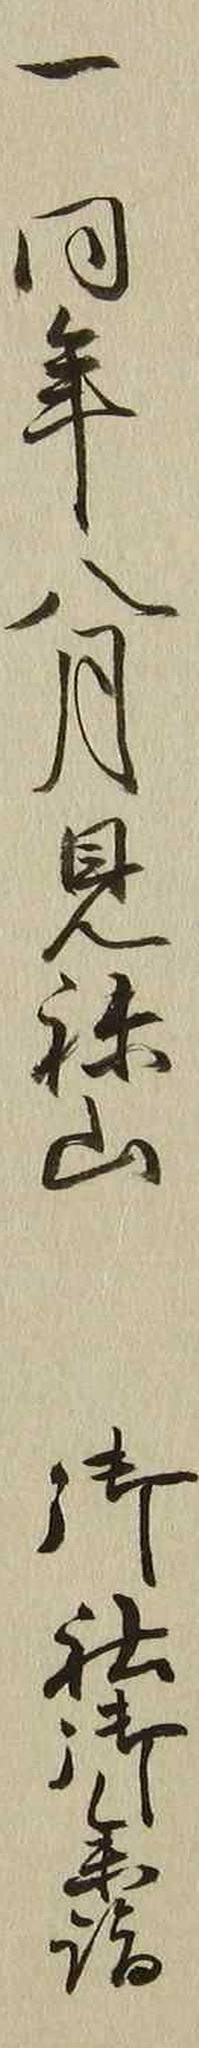一同年八月見祢山御社御参詣
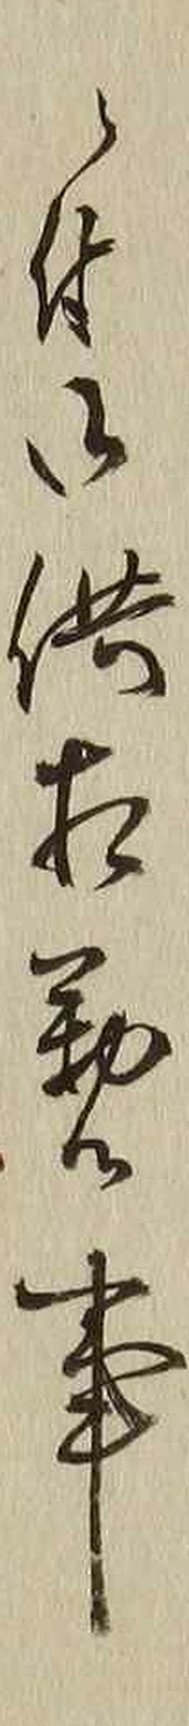ニ付御供相勤候事
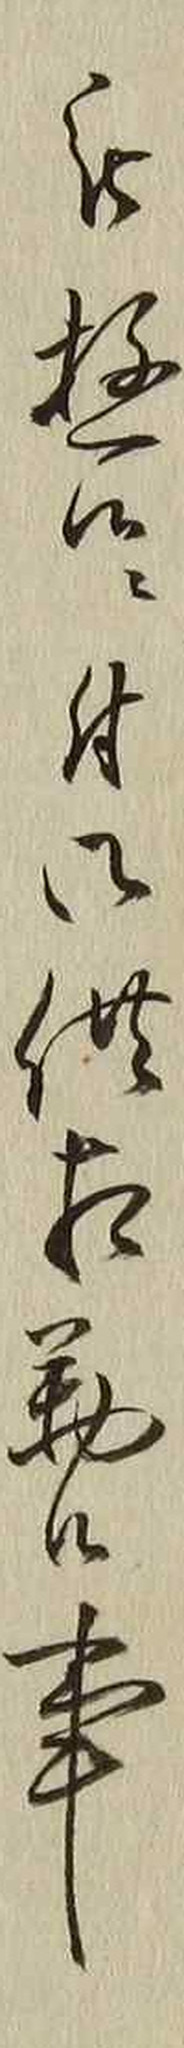被遊候ニ付御供相勤候事
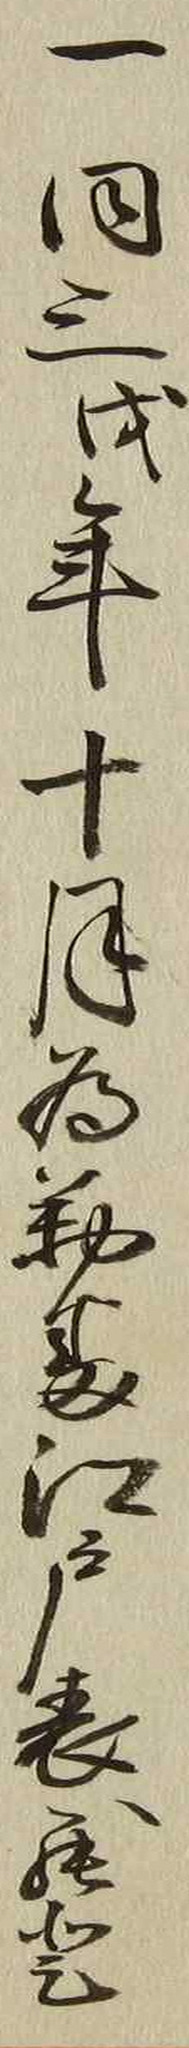一同三戌年十月為勤番江戸表へ罷登
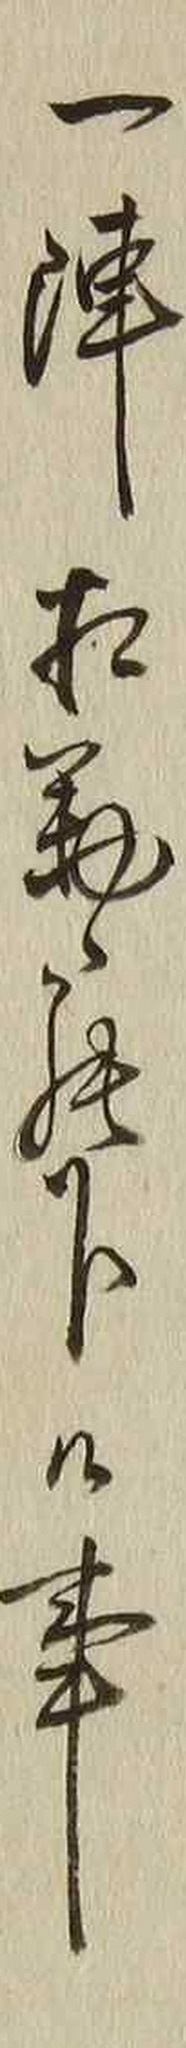一陣相勤候罷下候事
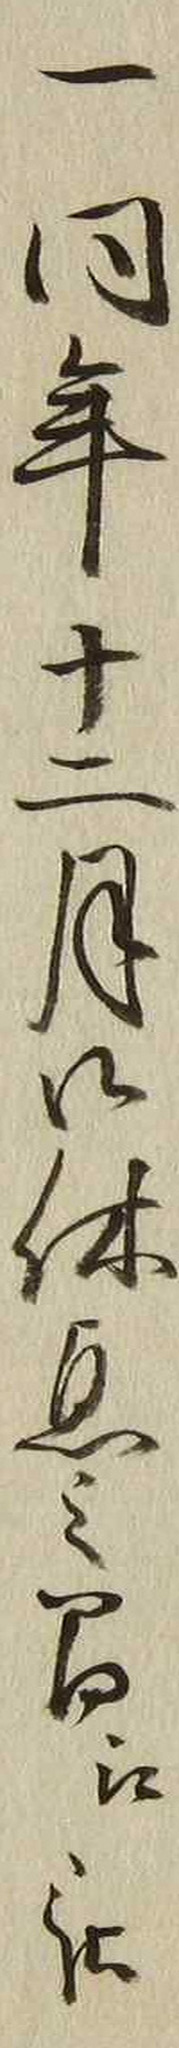一同年十二月御休息之間江被
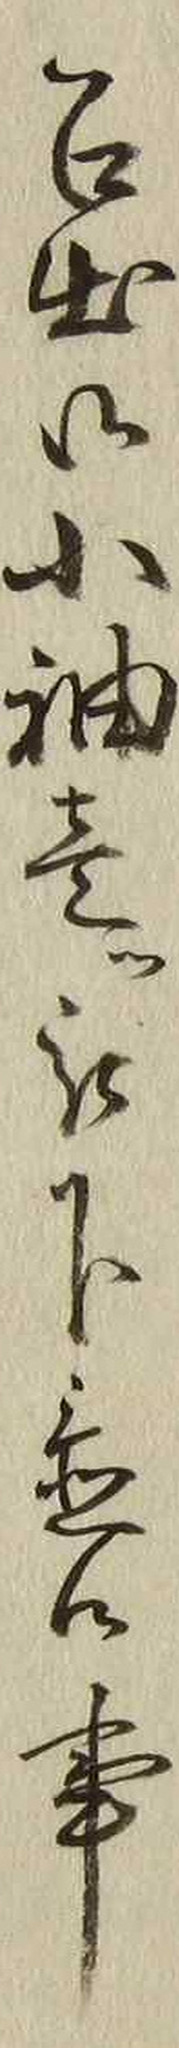召出御小袖壱ツ被下置候事
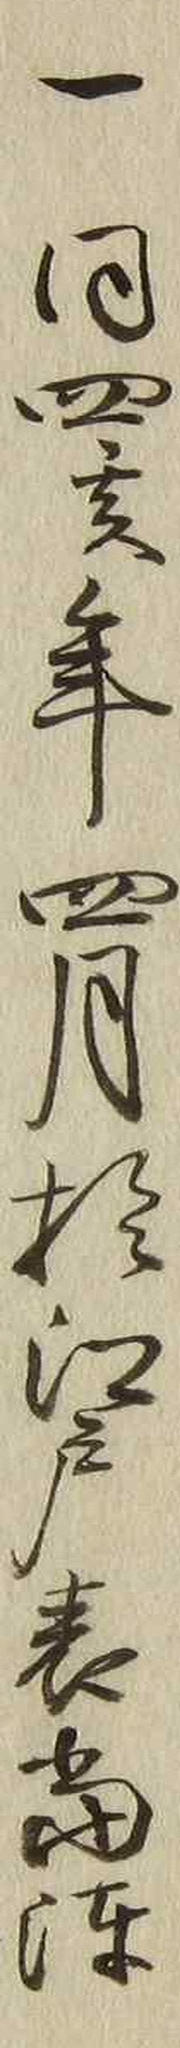一同四亥年四月於江戸表当陣
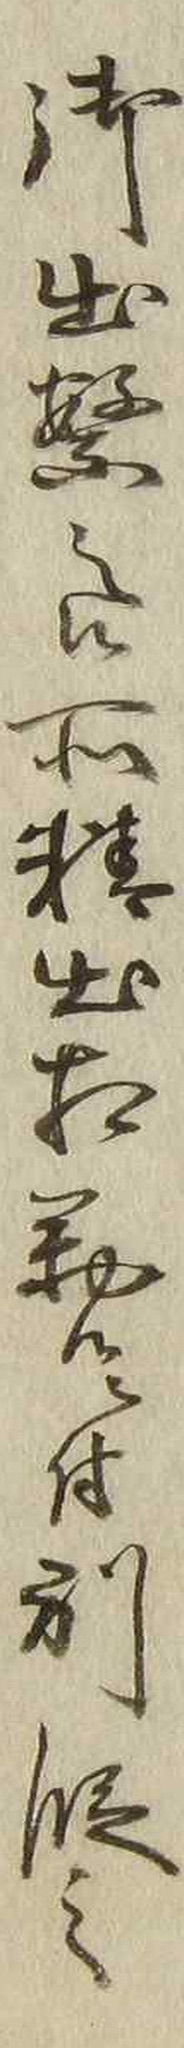御出繁之候所精出相勤候ニ付別段之
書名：諸士系譜　巻之60　と之部3
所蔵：会津若松市立会津図書館
